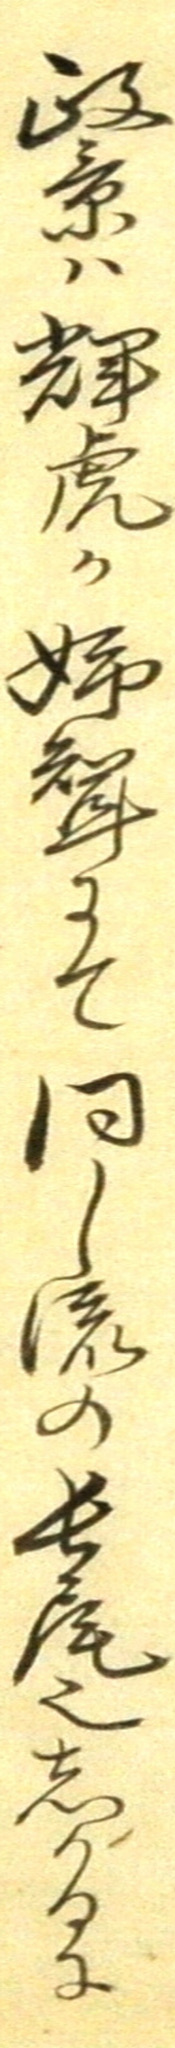政景は輝虎か姉聟にて同し流の長尾也しかるに
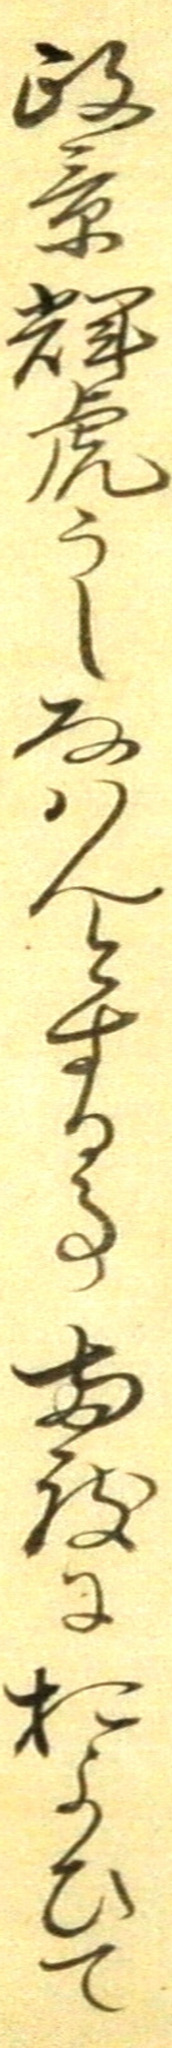政景輝虎うしなはんとする事両度におよひて
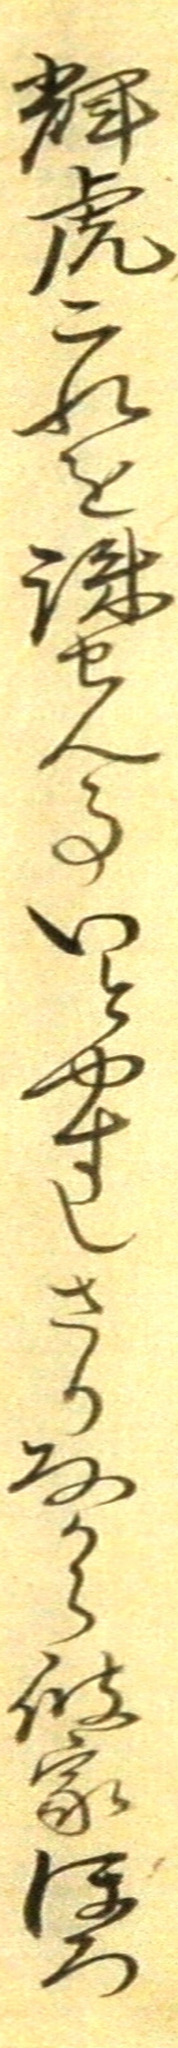輝虎これを誅せん事いとやすしさりなから彼家ほろ

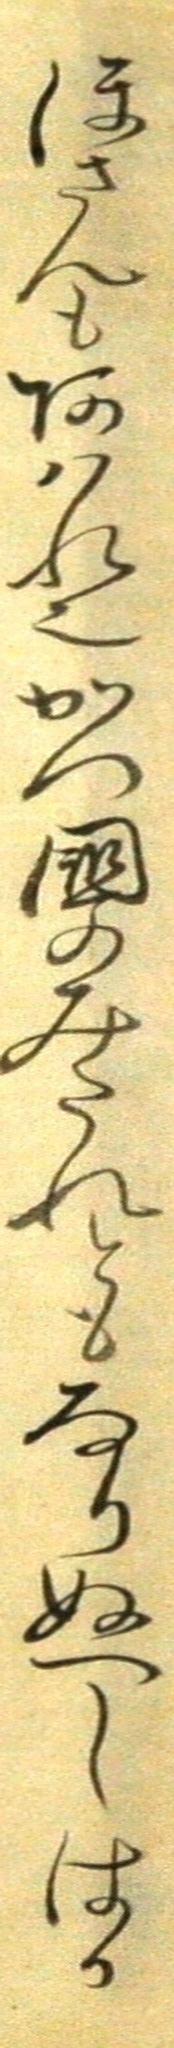ほさんもあはれ也かつ国のみたれともなりぬへしはか
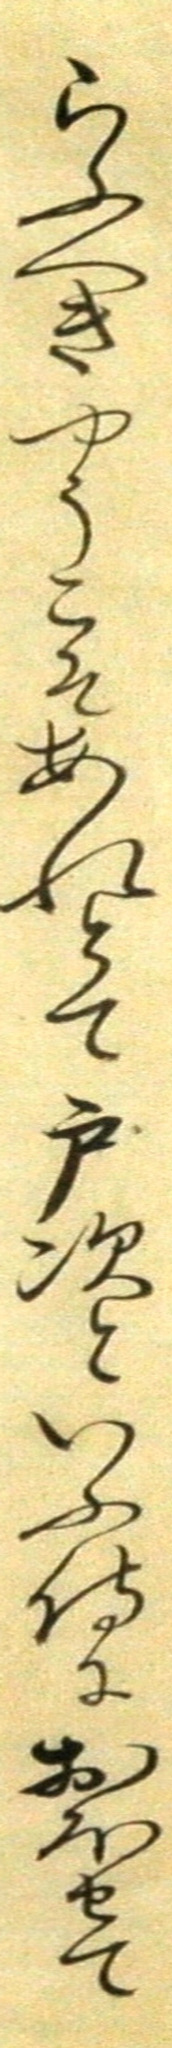らふへきやうこそあれとて戸次といふ侍におほせて
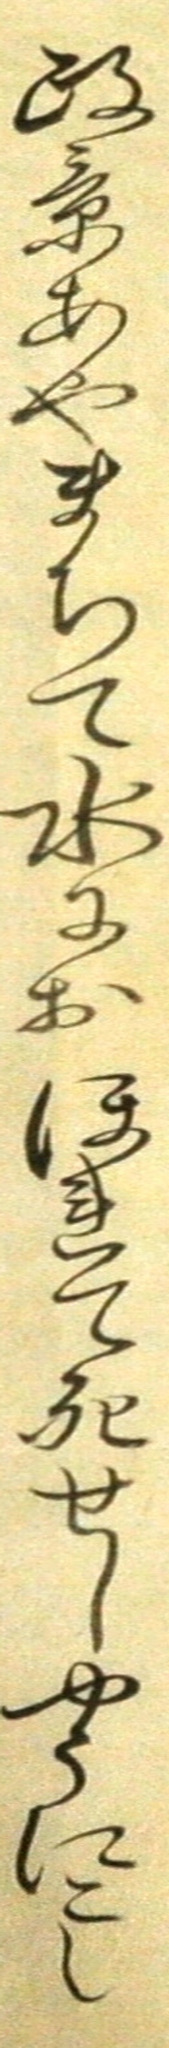政景あやまちて水におほれて死せしやうにこし
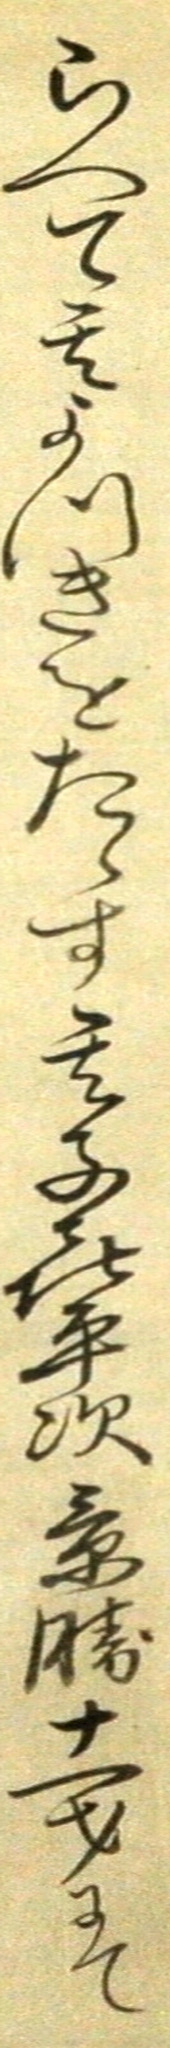らへて其よつきをたゝす其子喜平次景勝十一才にて
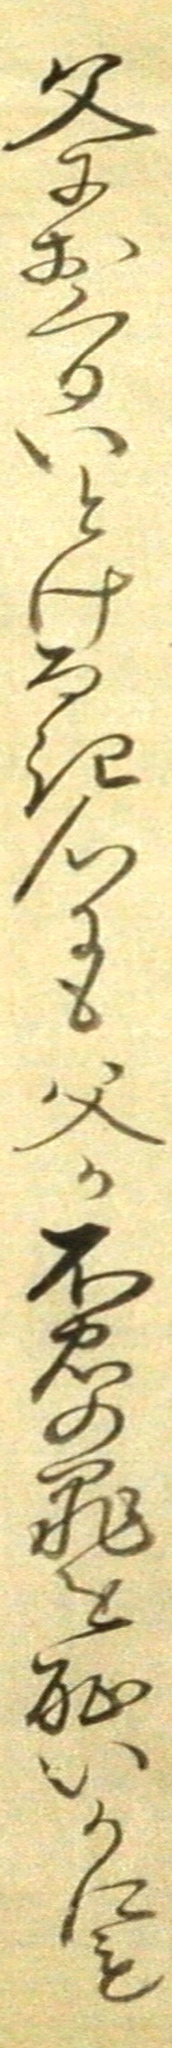父におくるいとけなき心にも父か不忠の罪を恥いかにも
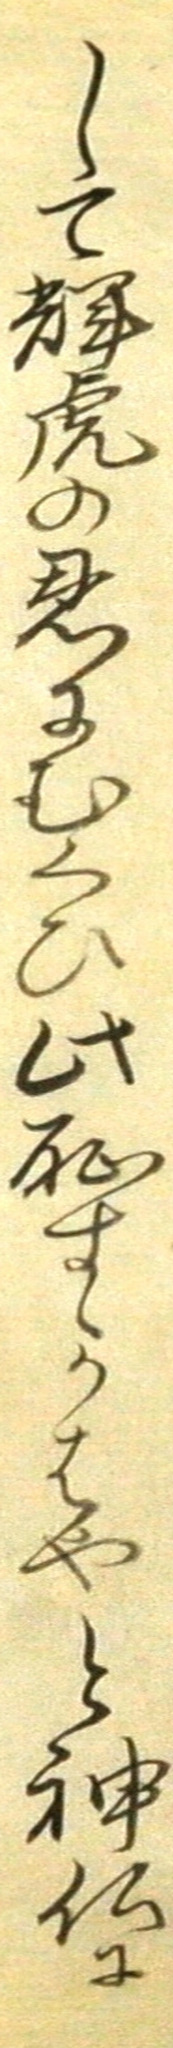して輝虎の恩にむくひ此恥すゝかはやと神仏に
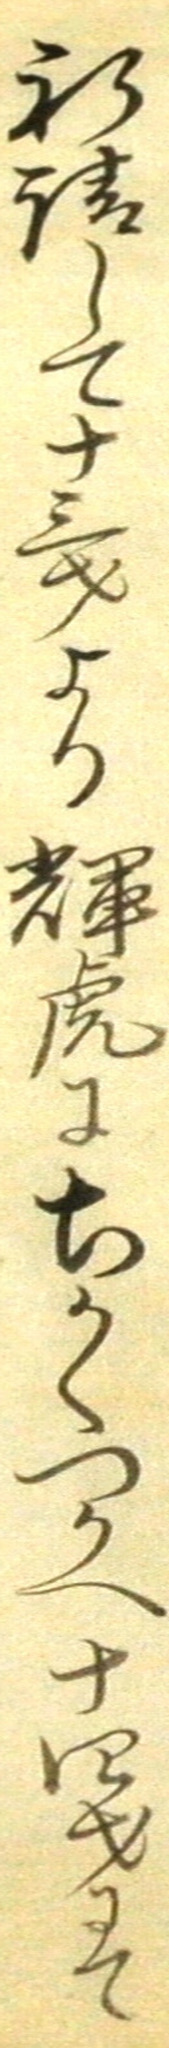祈請して十三才より輝虎にちかくつかへ十四才にて
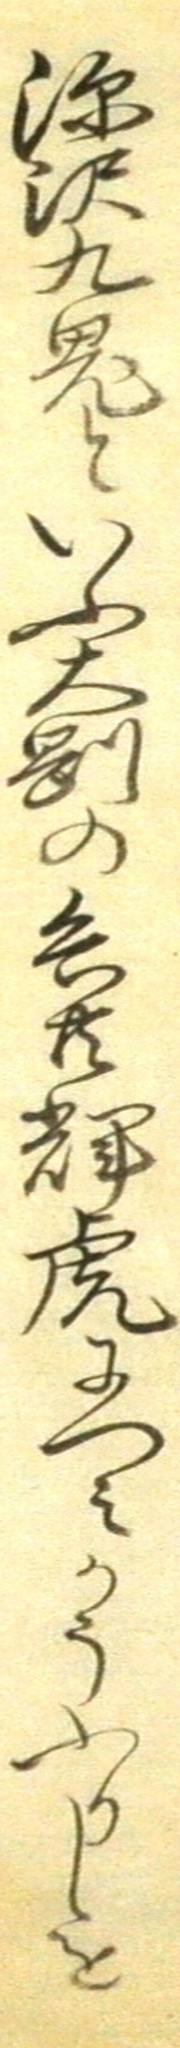深沢九鬼といふ大剛の兵共輝虎につみかうふりしを
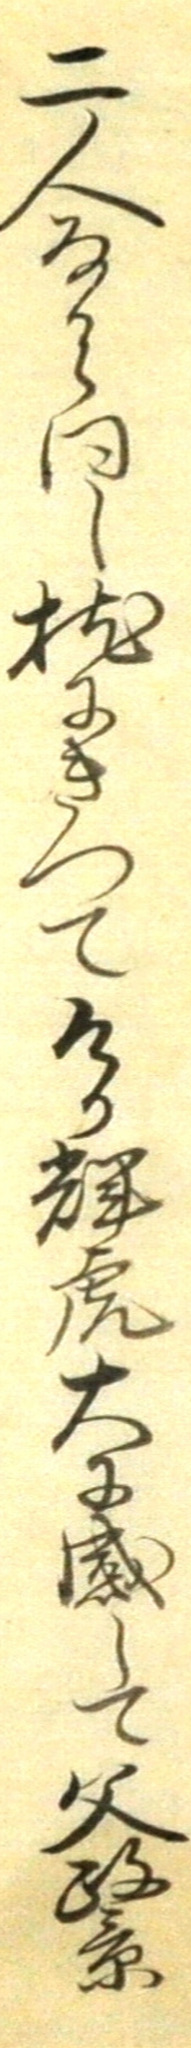二人なから同し枕にきつてけり輝虎大に感して父政景
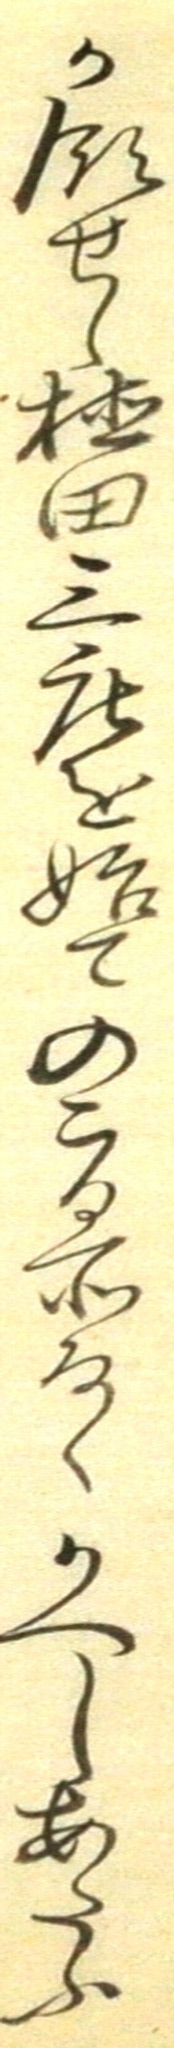か領せし植田三庄を始てのこる所なくかへしあたふ
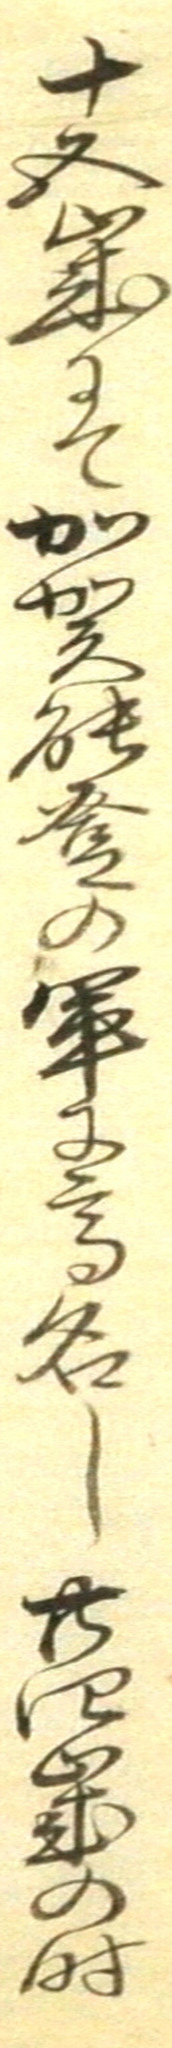十五歳にて加賀能登の軍に高名し廿四歳の時
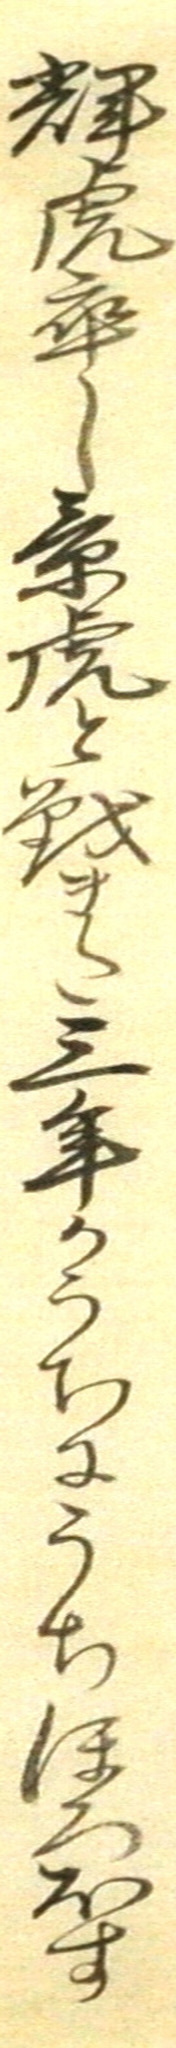輝虎卒し景虎と戦また三年かうちにうちほろほす
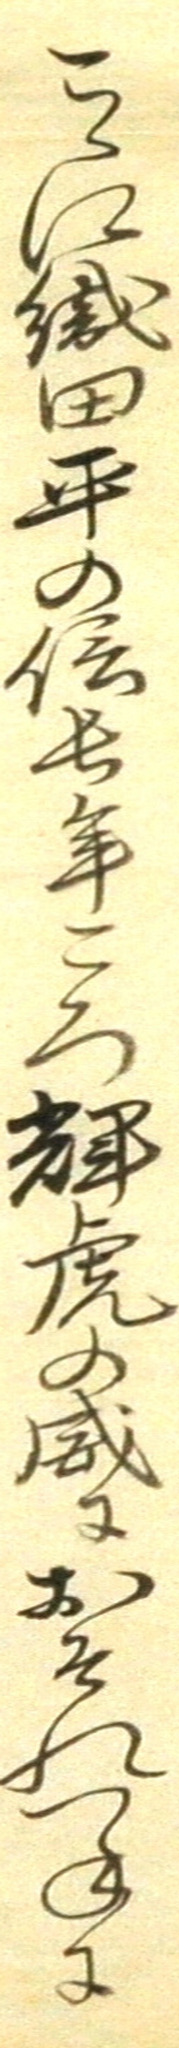こゝに織田平の信長年ころ輝虎の威におそれつねに
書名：藩翰譜（八・下）
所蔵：伊那市立高遠町図書館・合同会社AMANE
